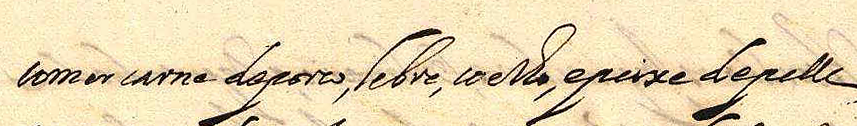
comer carne do porco, lebre, coelho, e peixe de pelle
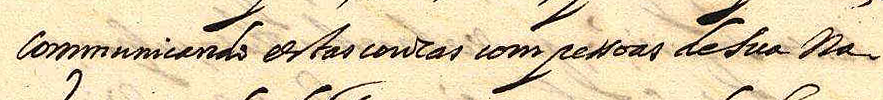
communicando estas couzas com pessoas de sua Na
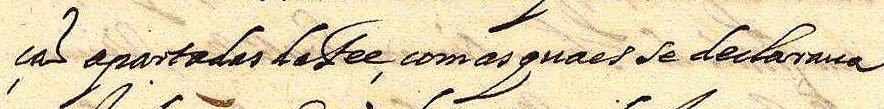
çaõ apartadas da Fee, com as quaes se declaraua
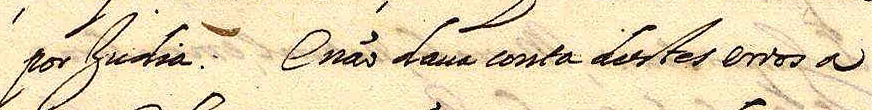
por Judia. E não daua conta destes erros a
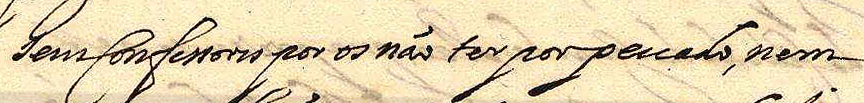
seus Confessores por os não ter por peccado, nem
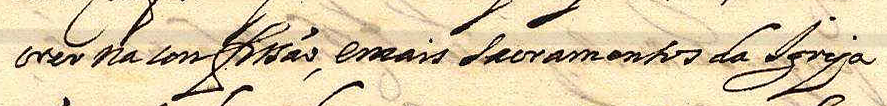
crer na confissaõ, e mais sacramentos da Igreja
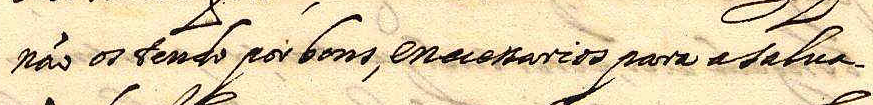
não os tendo por bons, e necessarios para a salua
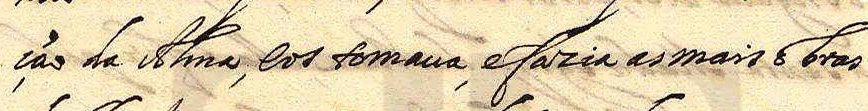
ção da Alma, e os tomaua, e fazia as mais obras
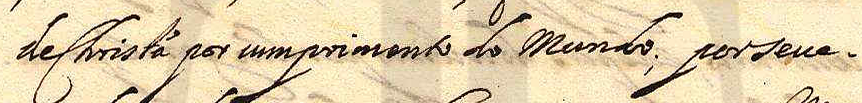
de Christã por cumprimento do Mundo; perseue
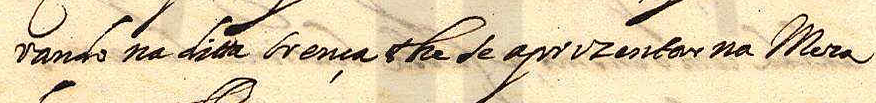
rando na ditta crença the se aprezentar na Meza
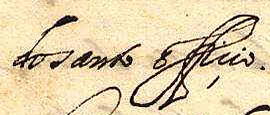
do santo officio.
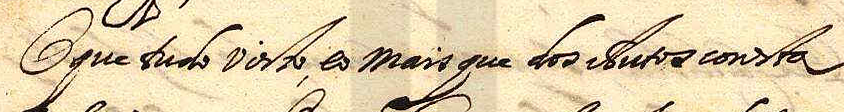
O que tudo visto, e o mais que dos Autos consta
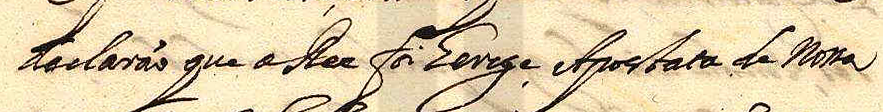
declaraõ que a Ree foi herege, Apostata de nossa
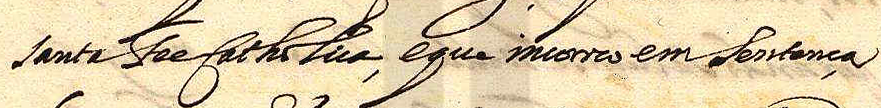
santa Fee Catholica, e que incorreo em Sentença
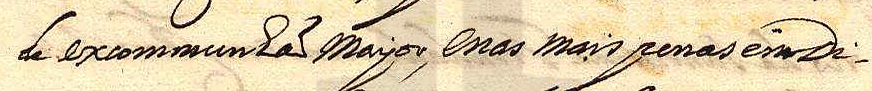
de excommunhaõ mayor, e nas mais penas em Di
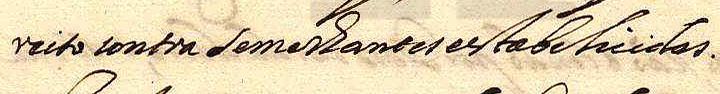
reito contra semelhantes estabelicidas.
